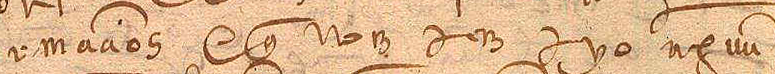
Jrmaãos e q̄ nom tem tyo nhuū
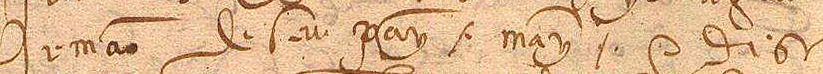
Jrmão de seu pay e māy /. e dise
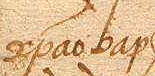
xpão bap
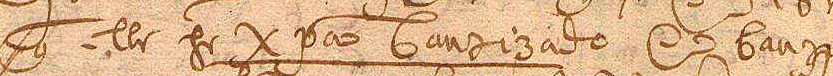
q̄ elle he Xpão bautizado e o bautj
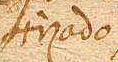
tizado
